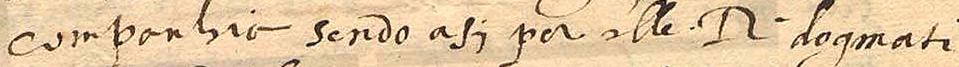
companhia sendo asy por elle .R. dogmati
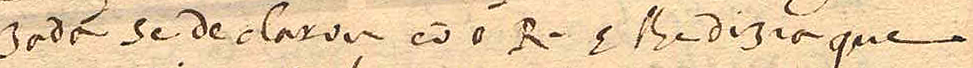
zada se declarou co̅ o R. E lhe dizia que
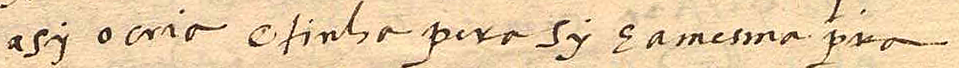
asy o cria e tinha pera sy E a mesma pra
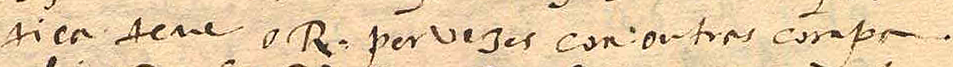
tica teue o R. per vezes con outras compa
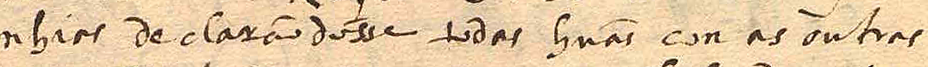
nhias declarão desse todas hu̅as con as outras
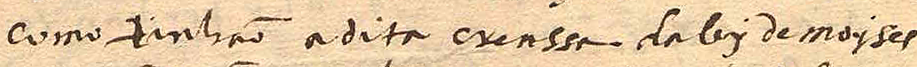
como tinhaõ a dita crenssa da ley de moyses
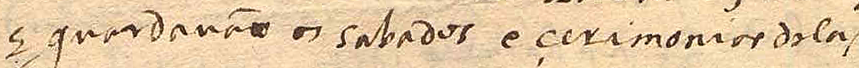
E guardauão os sabados e çerimonias dela /
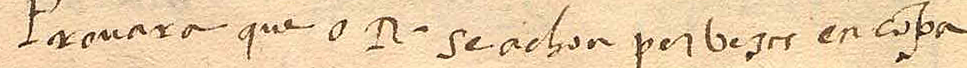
Prouara que o R. se achou per vezes en co̅pa
